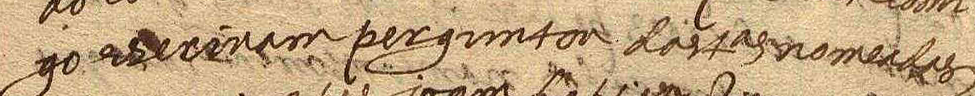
go Escriuam perguntou das tas nomeadas
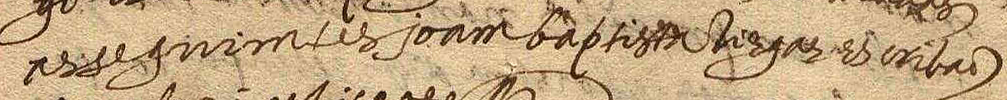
as seguimtes joam baptista viEgas Escrivaõ
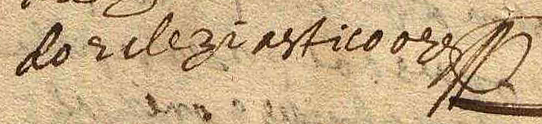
do Ecleziastico o Estp̄j
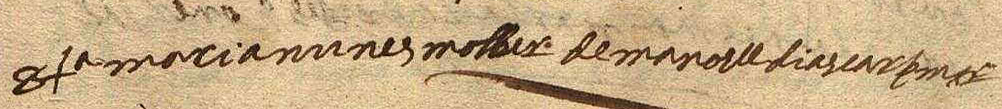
E ta maria nunes molher de manoell dias carpintro
